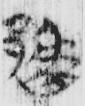○（閻）
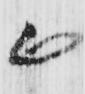㠯（以）
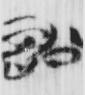訟
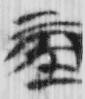坪
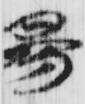昜（陽）
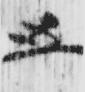之
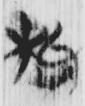枸
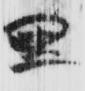里
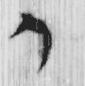人
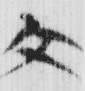文
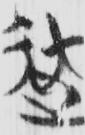适
